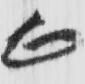㠯（以）
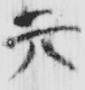亓（其）
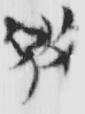敓（奪）
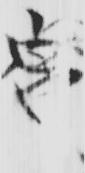妻
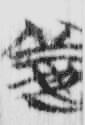義
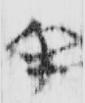牢
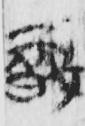戠
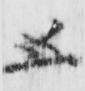之
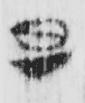旦
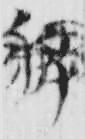捭
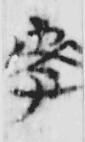李
